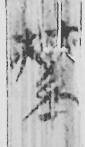縈
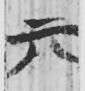亓
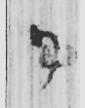身
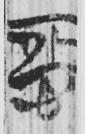{亙心}
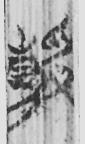靜
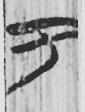于
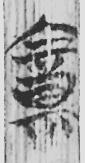{富示}
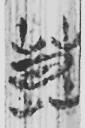莫
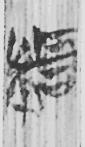紿
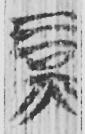庶
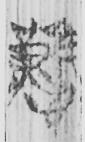戁（難）
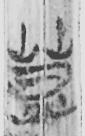莫
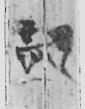卹
